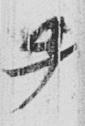子
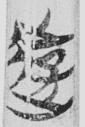遊（游）
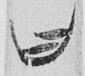曰
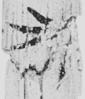又（有）
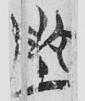○（地）
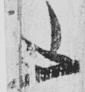之
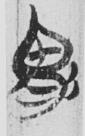{胃刀}（謂）
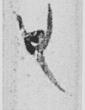也
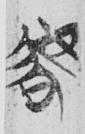○（乎）
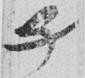子
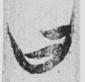曰
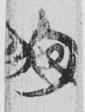○（偃）
